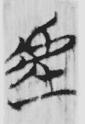𫊟
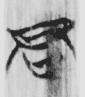君
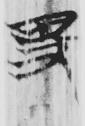卑
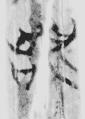若
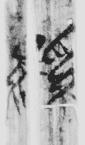{奚鳥}
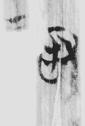{鳥取}
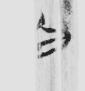白
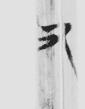父
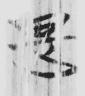是
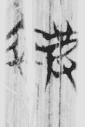被
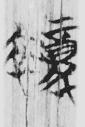複
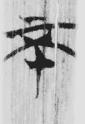不
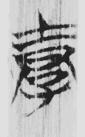{𫯁子}
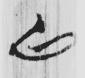㠯（以）
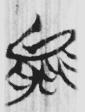能
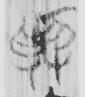與
